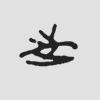徙
